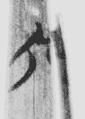六
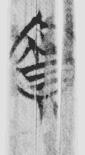{宀付貝}
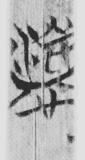{水盈}
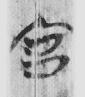宮
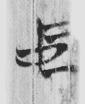𠁩
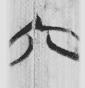六
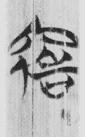{穴人告}
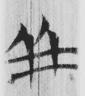并
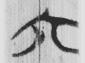六
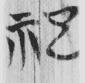祀
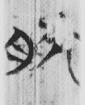肰
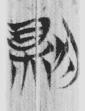則
